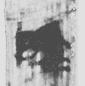爲
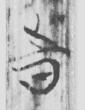{屮日}
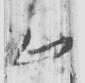㠯（以）
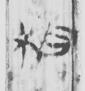相
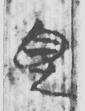見
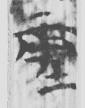坪
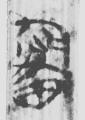{备勻}
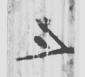之
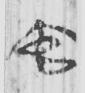{宀𠁩}
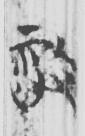鑿
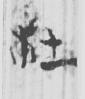杜
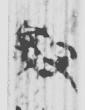敘
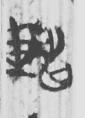{車申}
